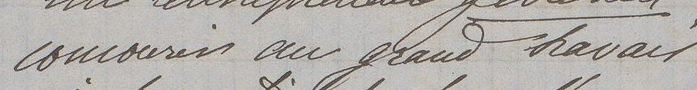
concourir au grand travail
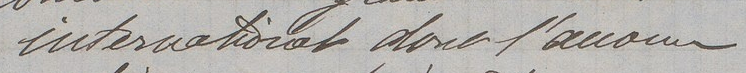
international dont l'accom-
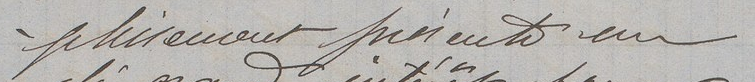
plissement présente un
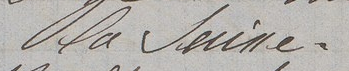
la Suisse.
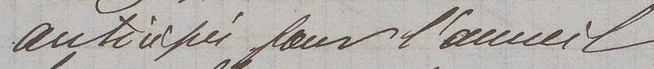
anticipés pour l'accueil
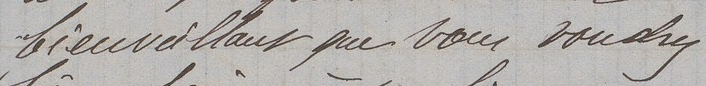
bienveillant que vous voudrez
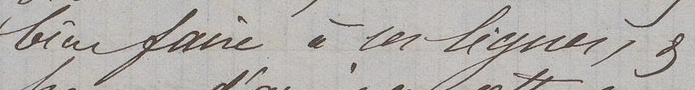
bien faire à ces lignes, &
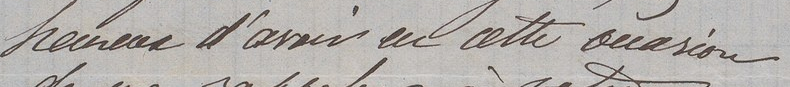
heureux d'avoir eu cette occasion
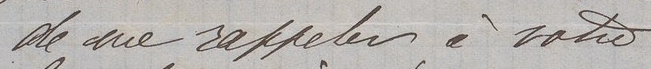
de me rappeler à votre
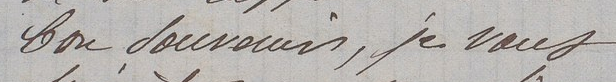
bon souvenir, je vous
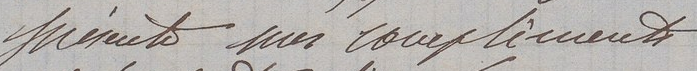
présente mes compliments
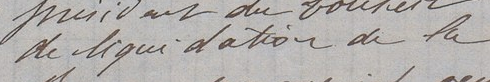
de liquidation de la
